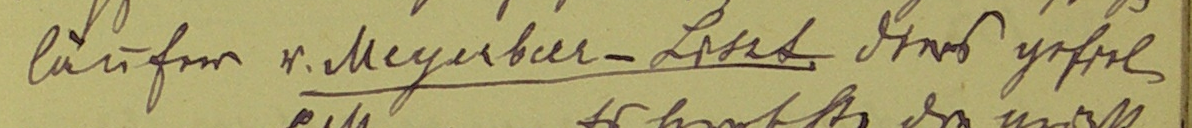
läufer von Meyerbeer-Liszt dies gefiel
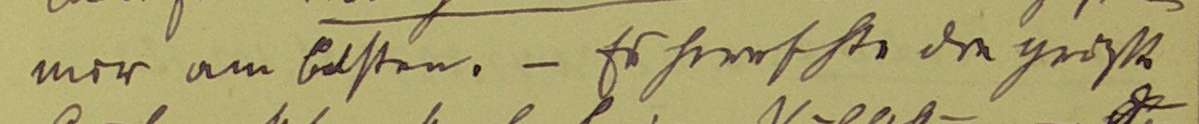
mir am besten.- Es herrschte die größte
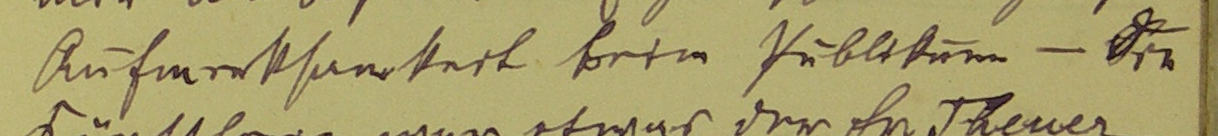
Aufmerksamkeit beim Publikum- Die
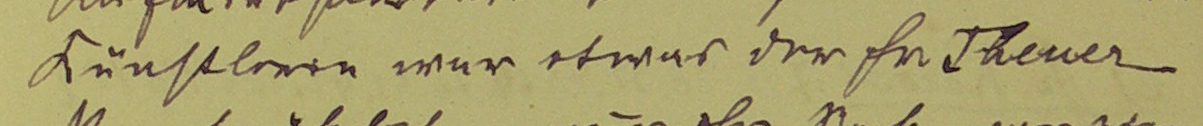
Künstlerin war etwas der Fr. Theuer¬
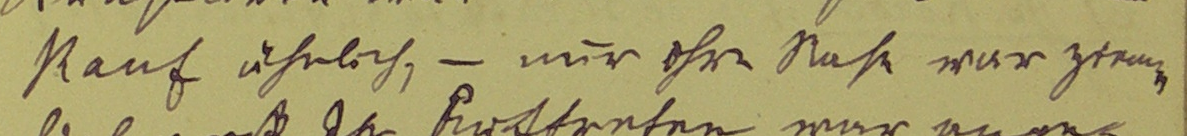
Kauf ähnlich;-- nur ihre Nase war ziem¬
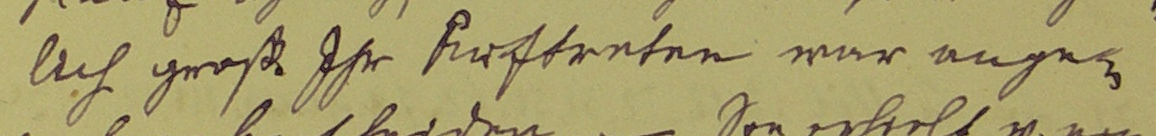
lich groß.- Ihr Auftreten war ange¬
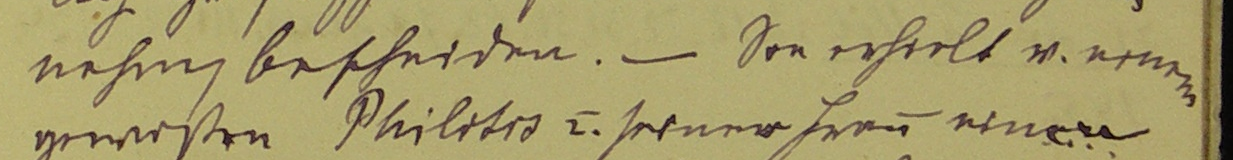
nehm bescheiden.- Sie erhielt von einem
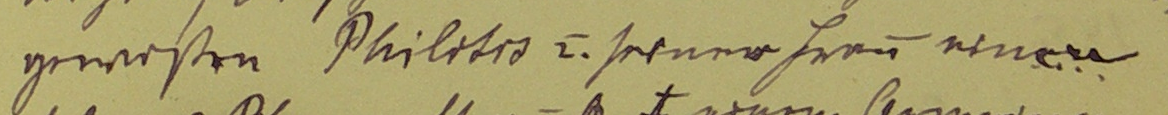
gewißen Philotos und seiner Frau einen
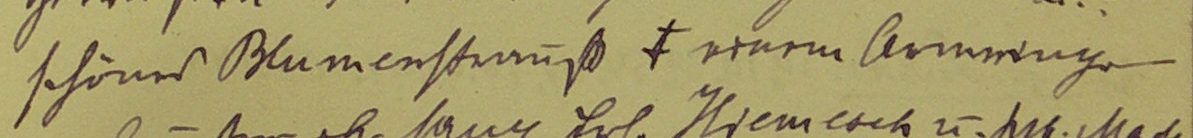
schönen Blumenstrauß mit einem Armring.
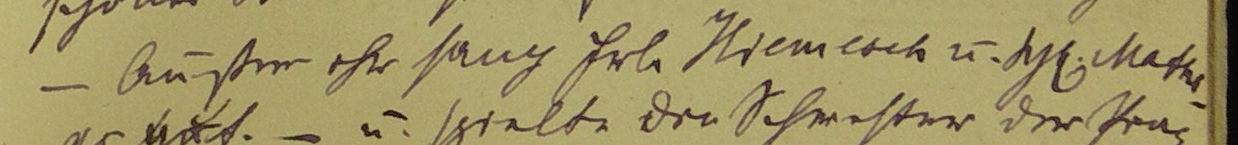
- Außer ihr sang Frl. Hiemesch und Herr Mathi¬
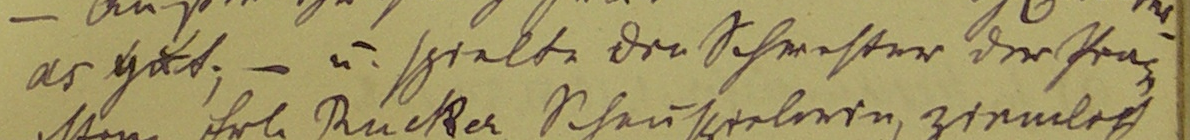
as gut;- und spielte die Schwester der Pia¬
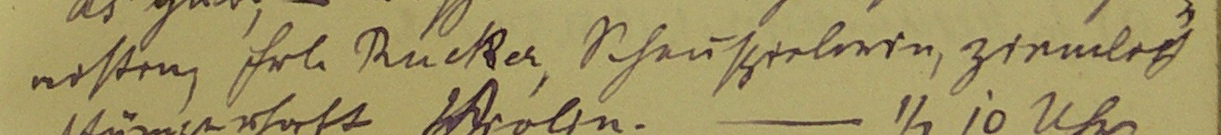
nistin Frl. Rucker, Schauspielerin , ziemlich
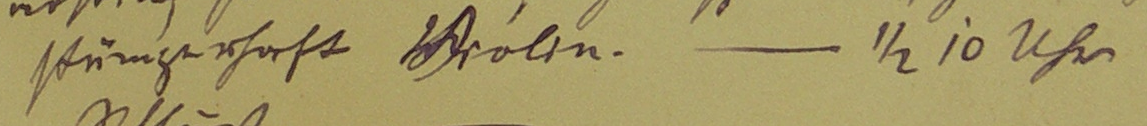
stümperhaft Violin. - 1/2 10 Uhr
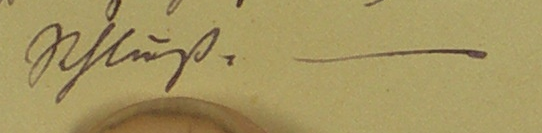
Schluß.---
